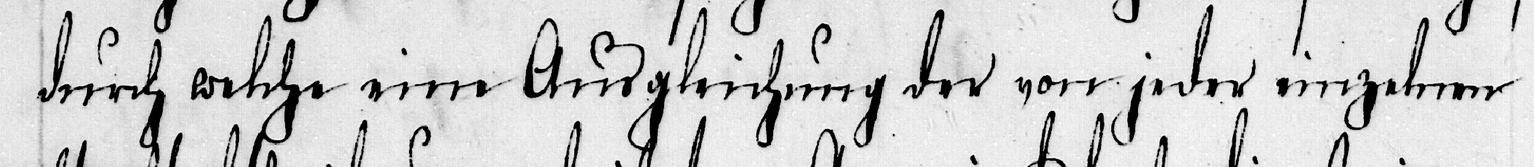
durch welche eine Ausgleichung der von jeder einzelnen
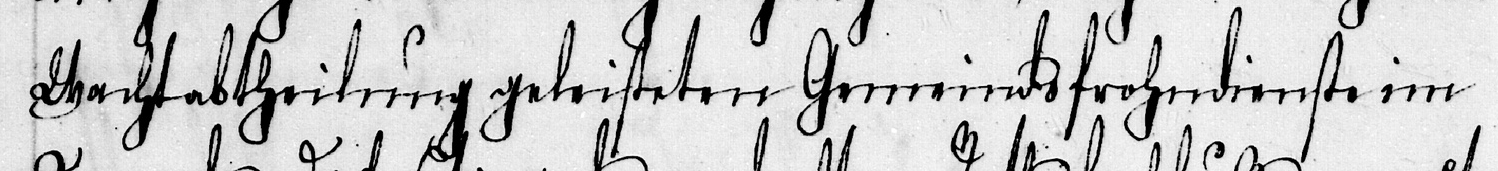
Wachtabtheilung geleisteten Gemeindsfrohndienste im
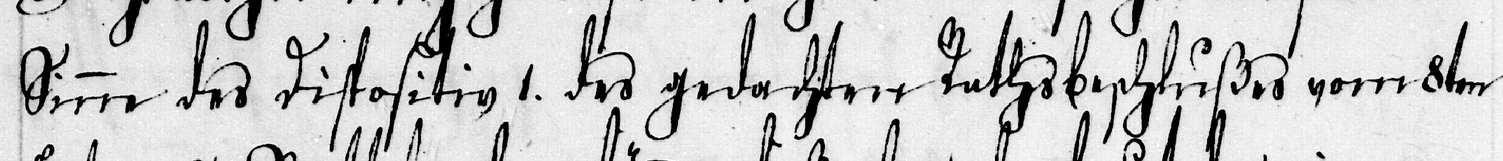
Sinne des Dispositiv 1. des gedachten Rathsbeschlußes vom 8ten
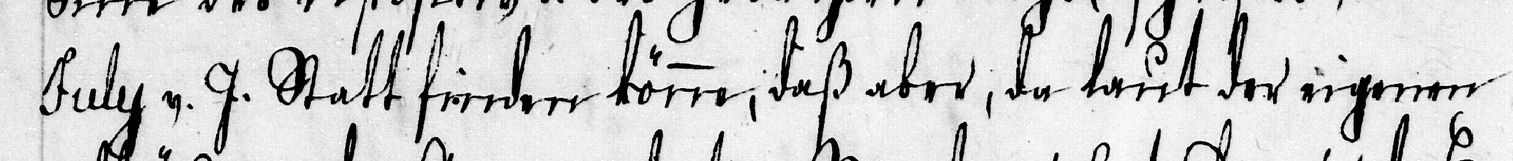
July v. J. Statt finden könne, daß aber, da laut der eigenen
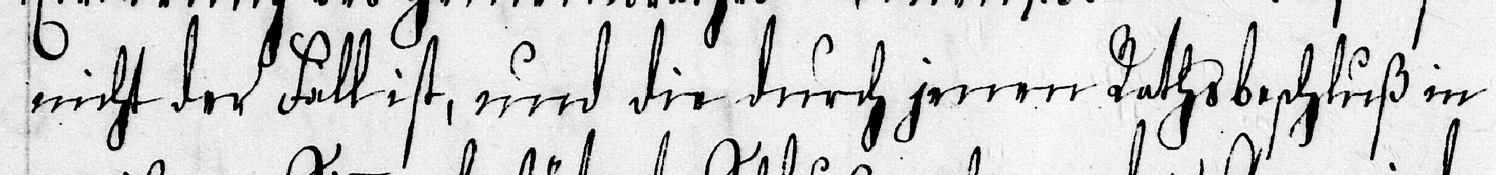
nicht der Fall ist, und die durch jenen Rathsbeschluß in
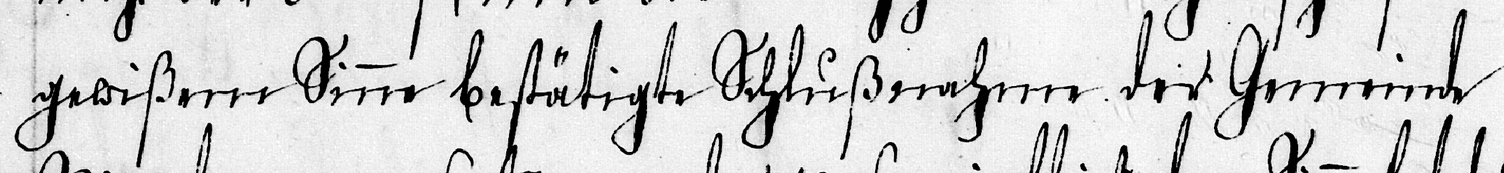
gewißem Sinne bestätigte Schlußnahme der Gemeinde
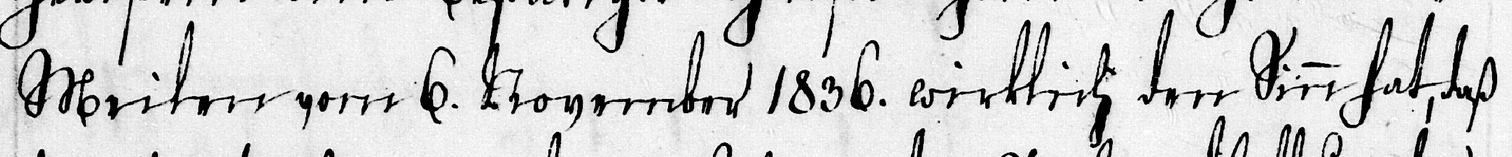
Meilen vom 6. November 1836. wirklich den Sinn hat, daß
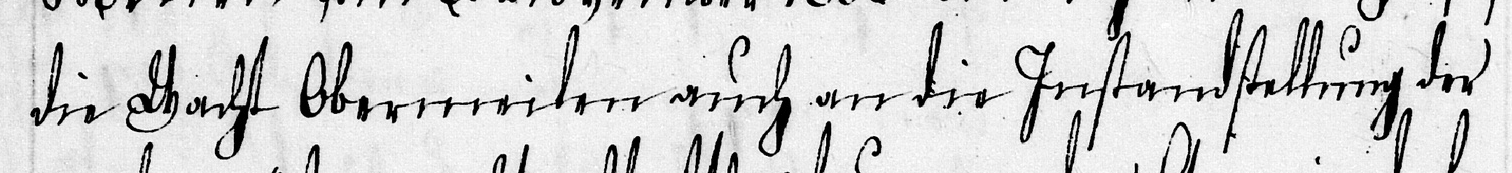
die Wacht Obermeilen auch an die Instandstellung der
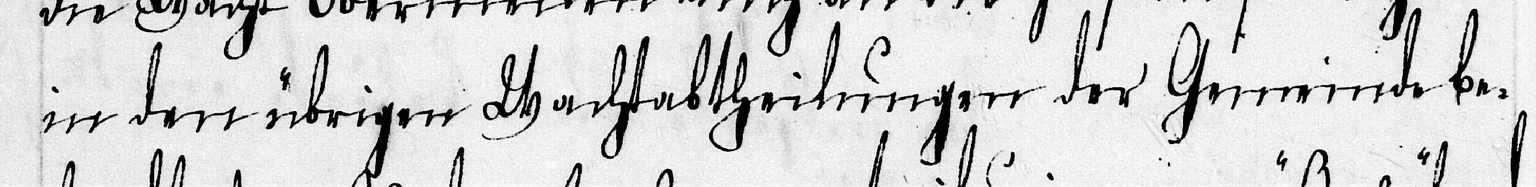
in den übrigen Wachtabtheilungen der Gemeinde be¬
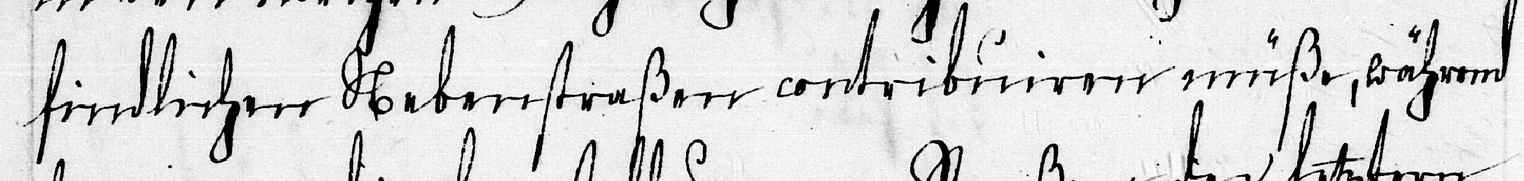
findlichen Nebenstraßen contribuiren müße, während
